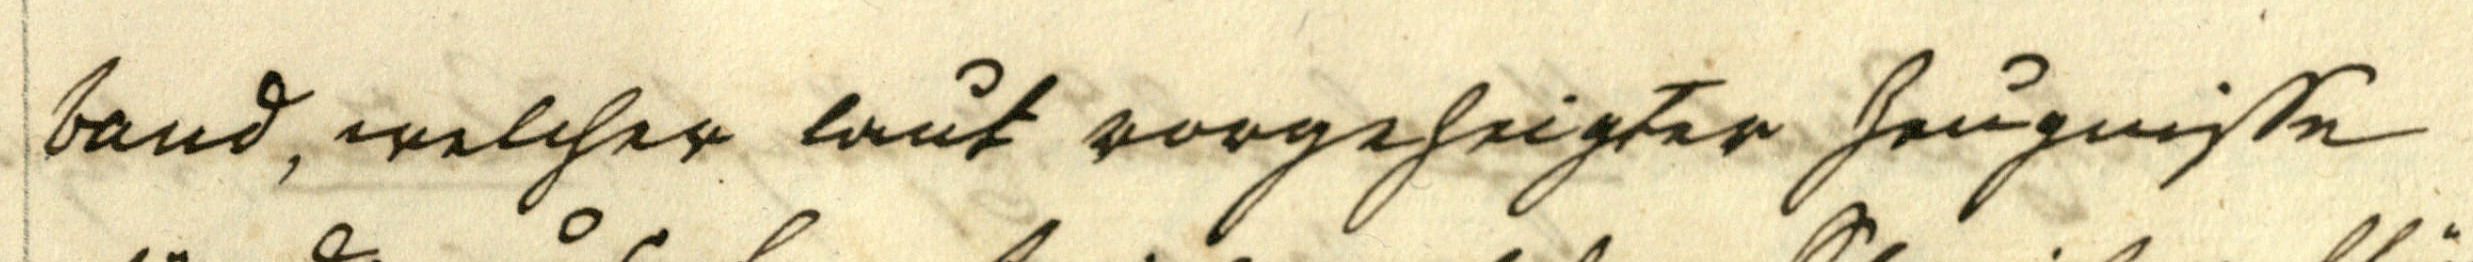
band, welcher laut vorgezeigter Zeugnisse
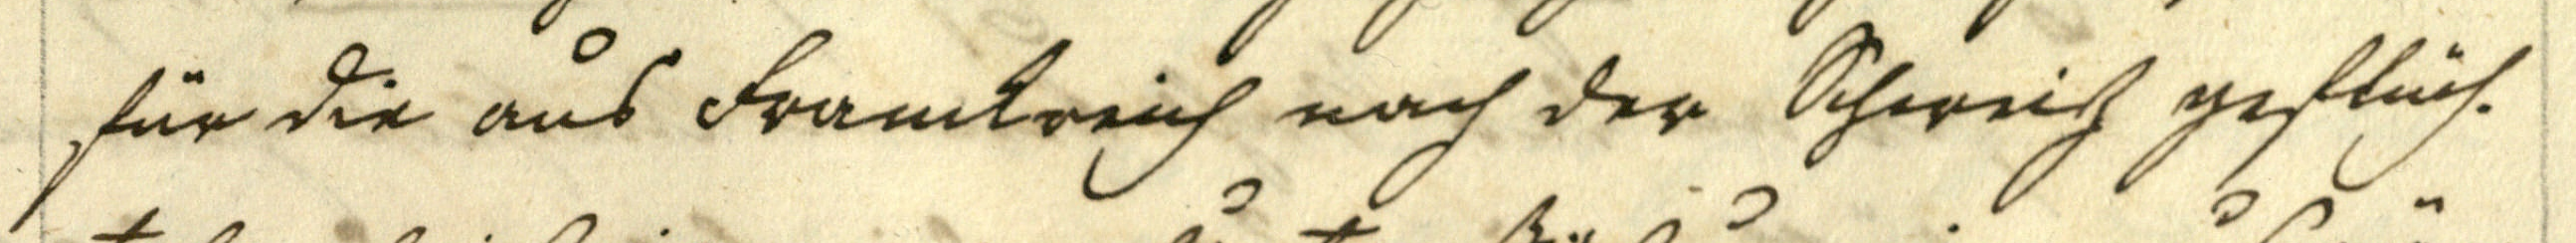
für die aus Franckreich nach der Schweiz geflüch¬
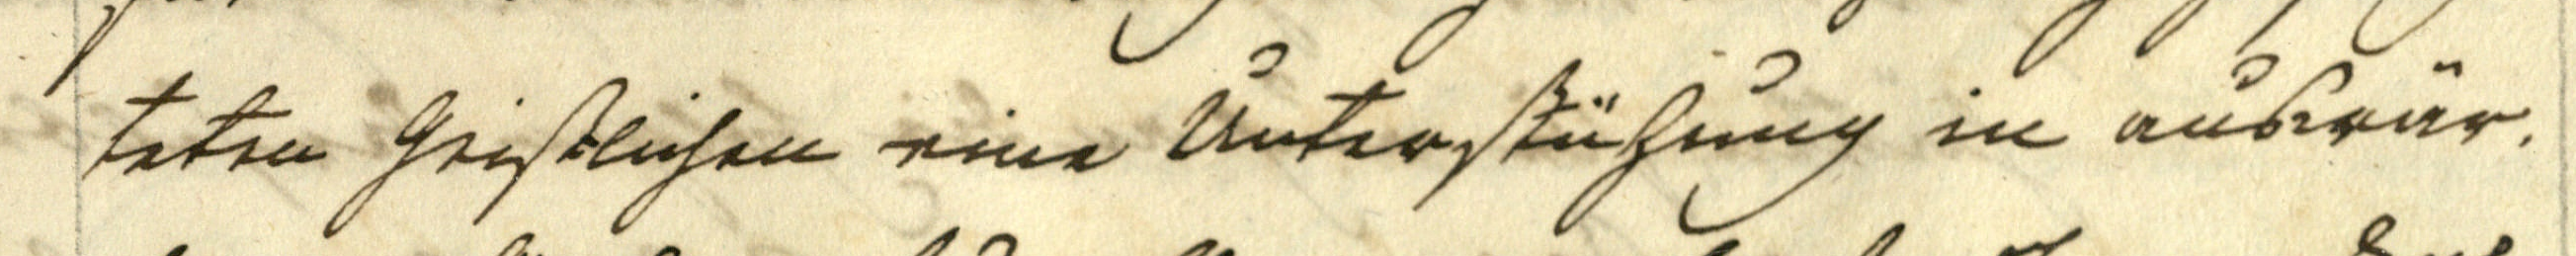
teten Geistlichen eine Unterstützung in auswär¬
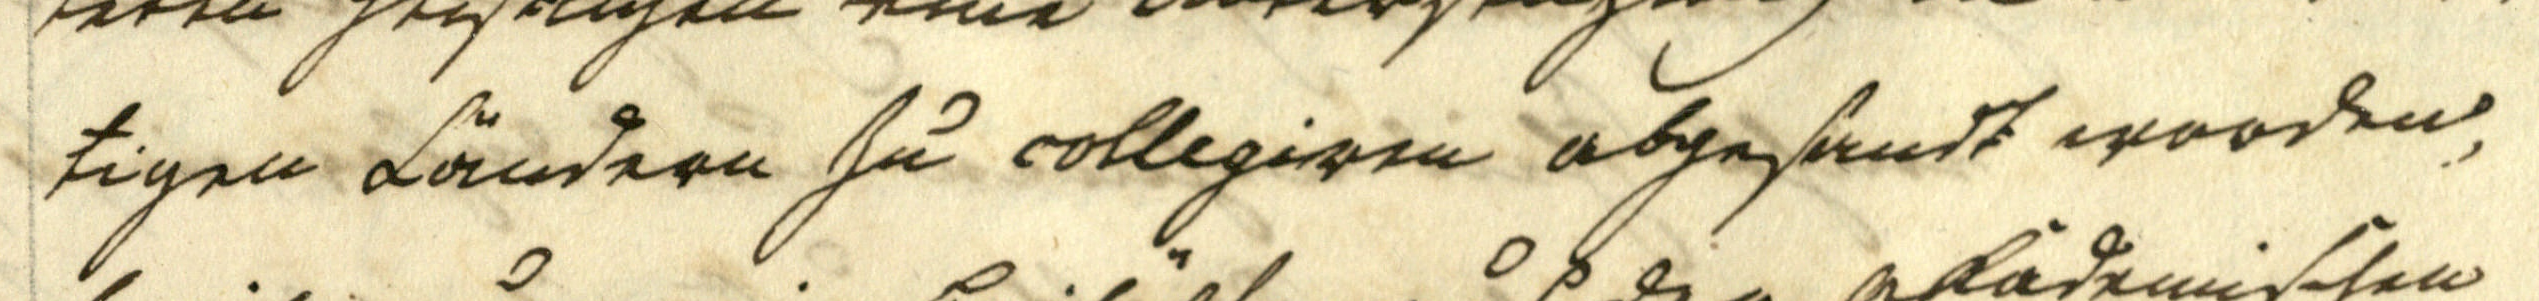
tigen Ländern zu collegiren abgesandt worden,
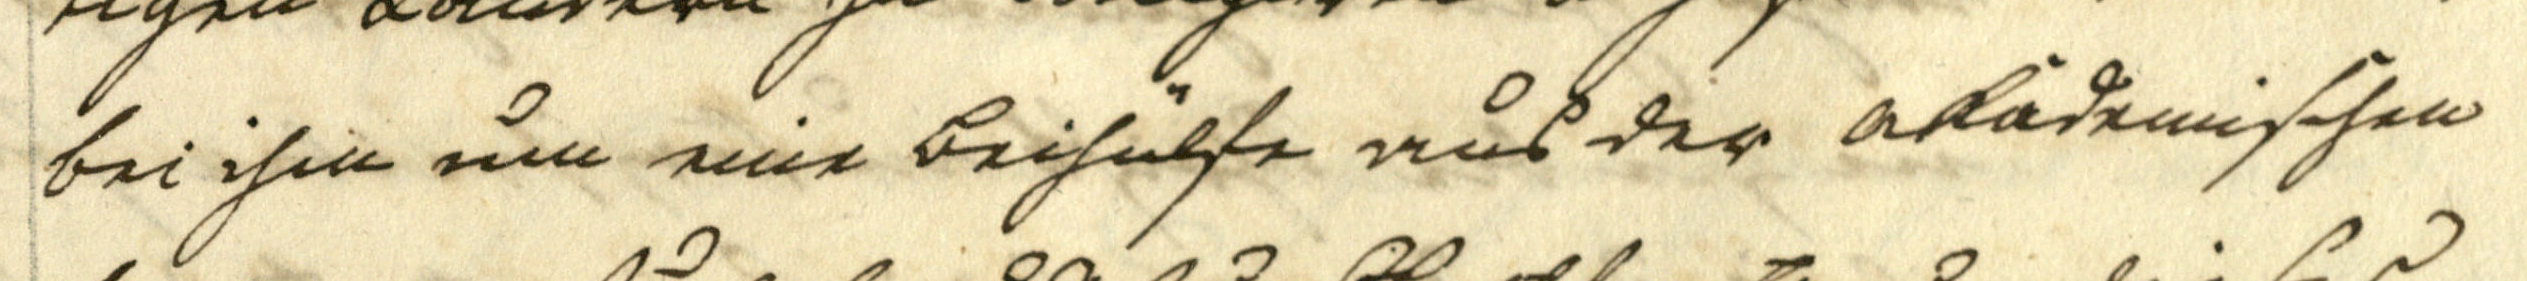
bei ihm um eine Beihülfe aus der akademischen
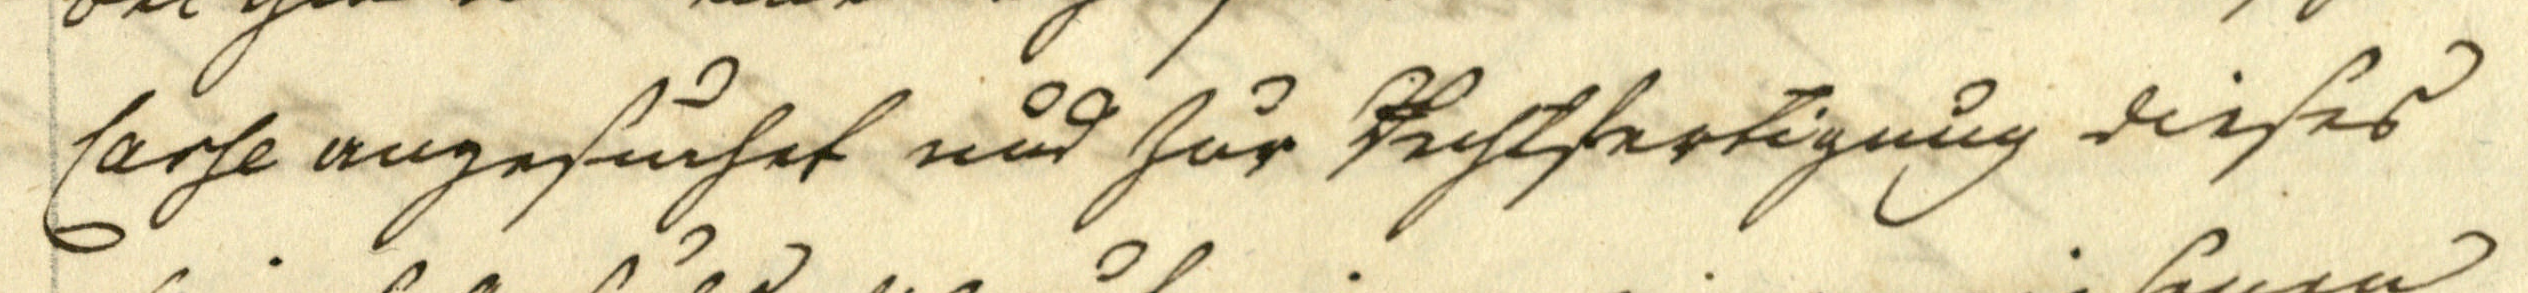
Casse angesuchet und zur Rechtfertigung dieses
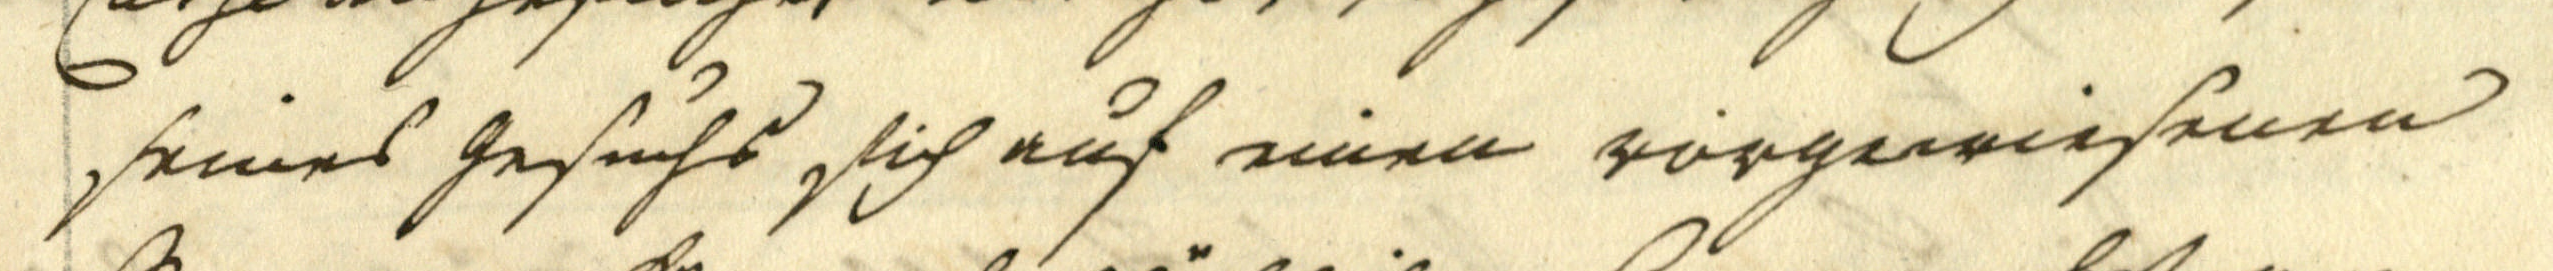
seines Gesuchs sich auf einen vorgewiesenen
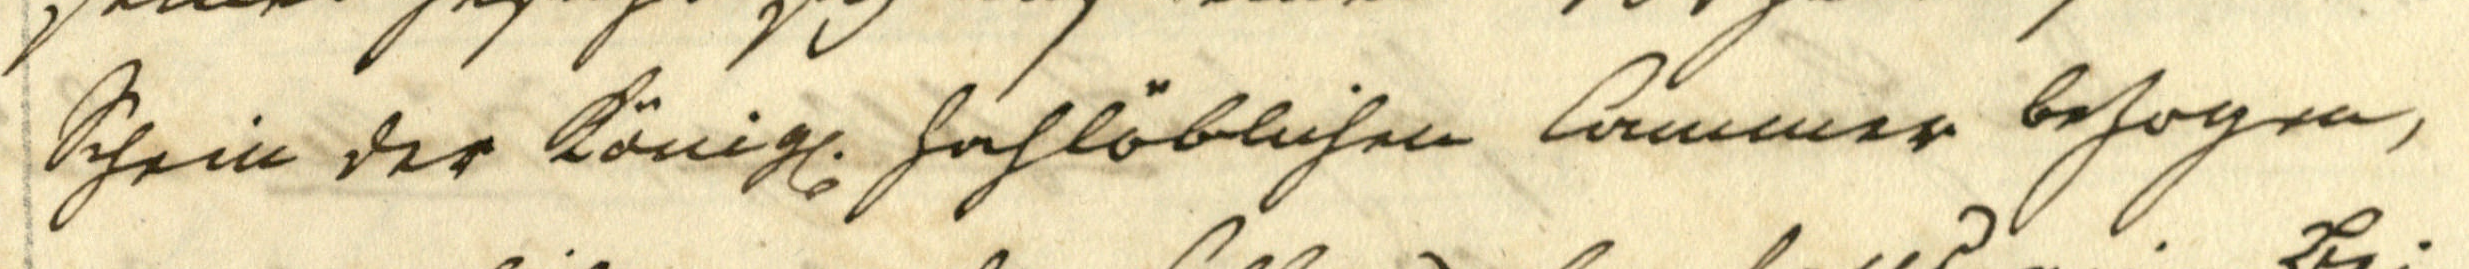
Schein der Königl. Hochlöblichen Cammer bezogen,
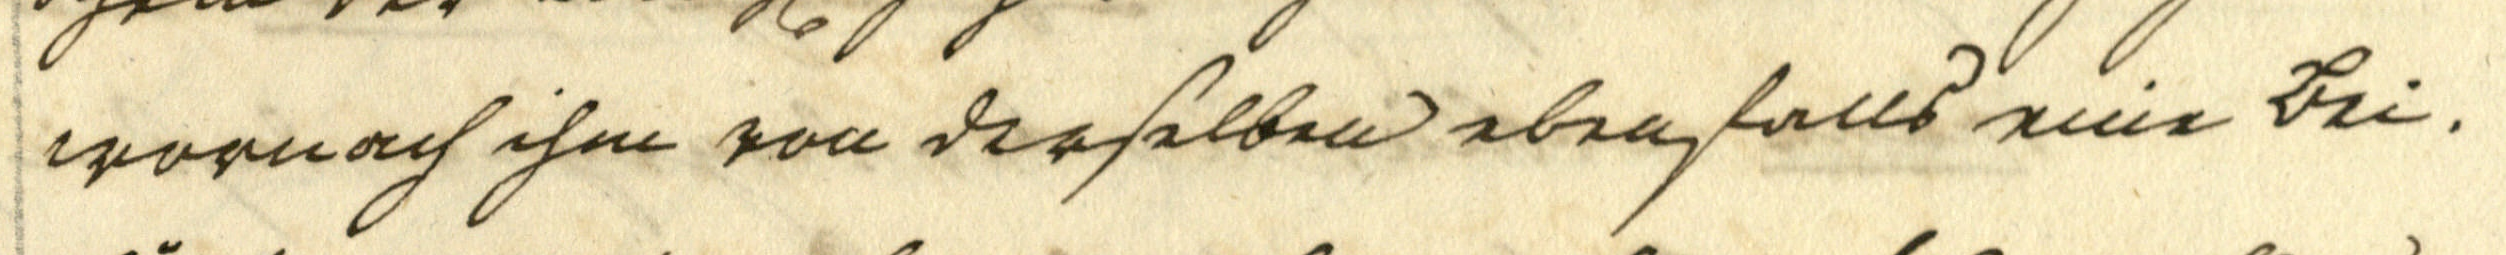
wornach ihm von derselben ebenfalls eine Bei¬
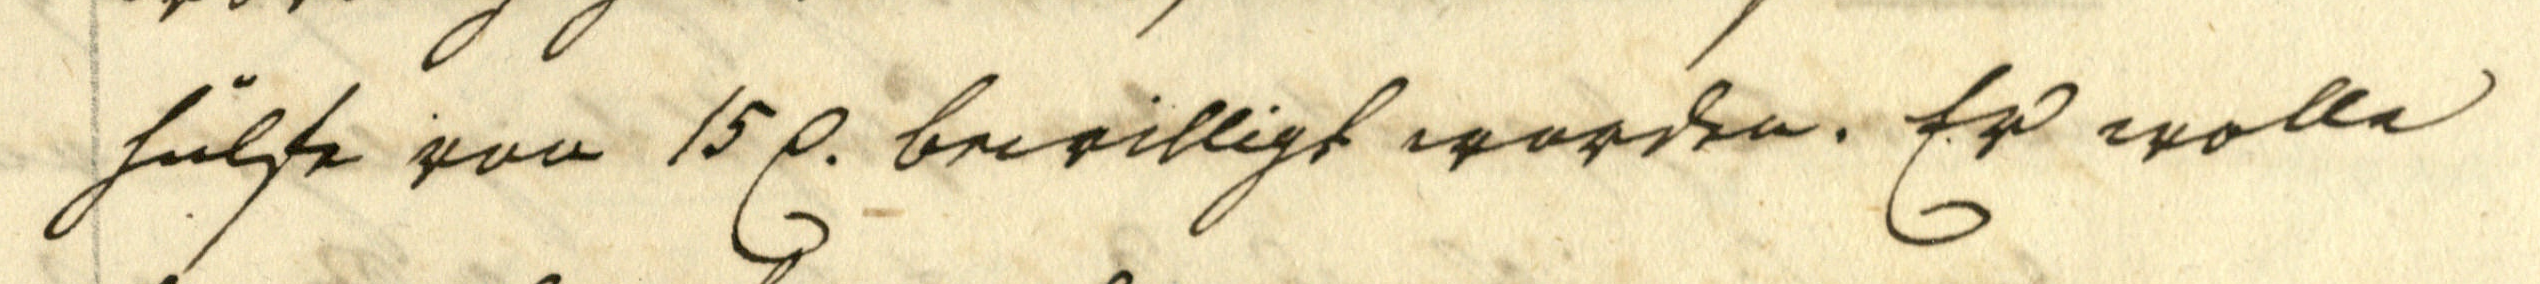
hülfe von 15 l. bewilligt worden. Er wolle
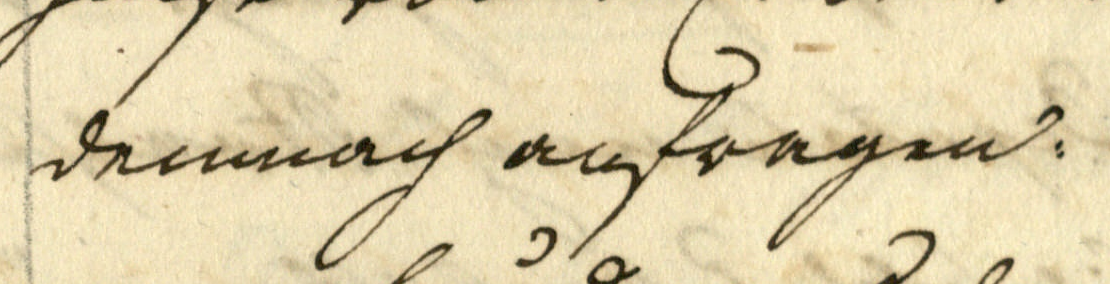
demnach anfragen:
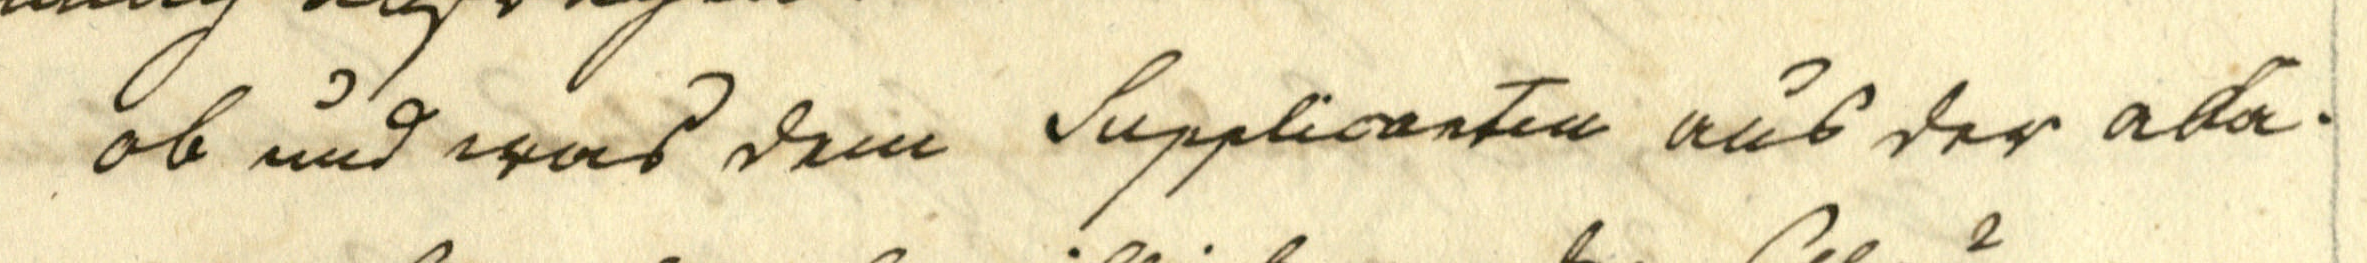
ob und was dem Supplicanten aus der aka¬
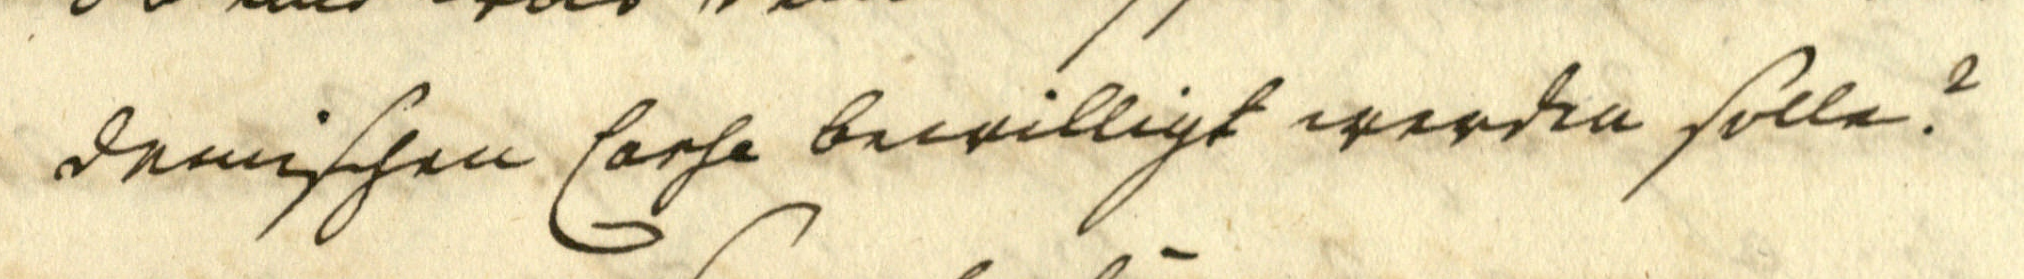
demischen Casse bewilligt werden solle?
